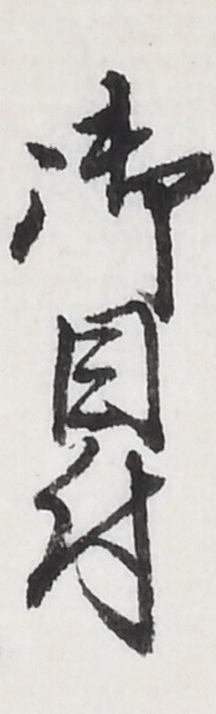御目付
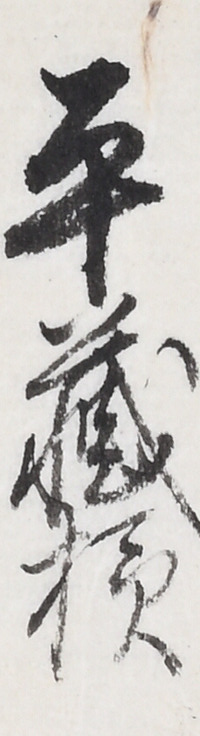平蔵様
